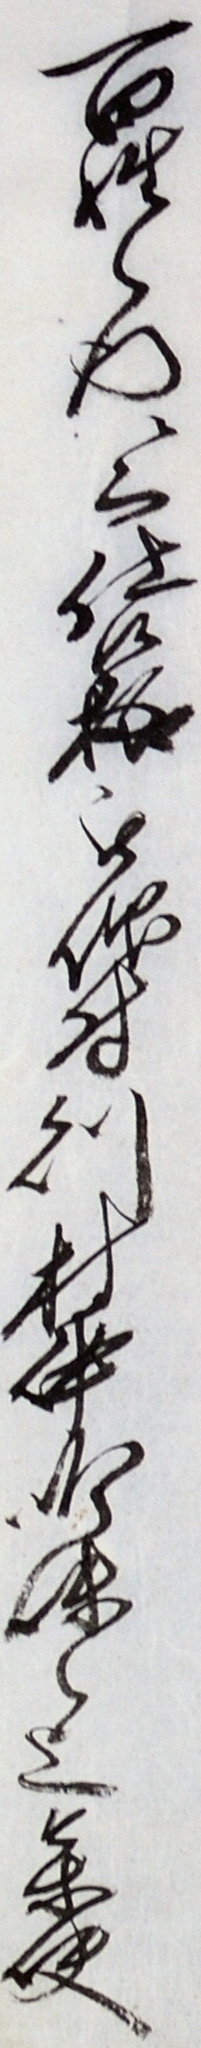百姓之内ニ而仕候様被仰付則村中吟味之上参使
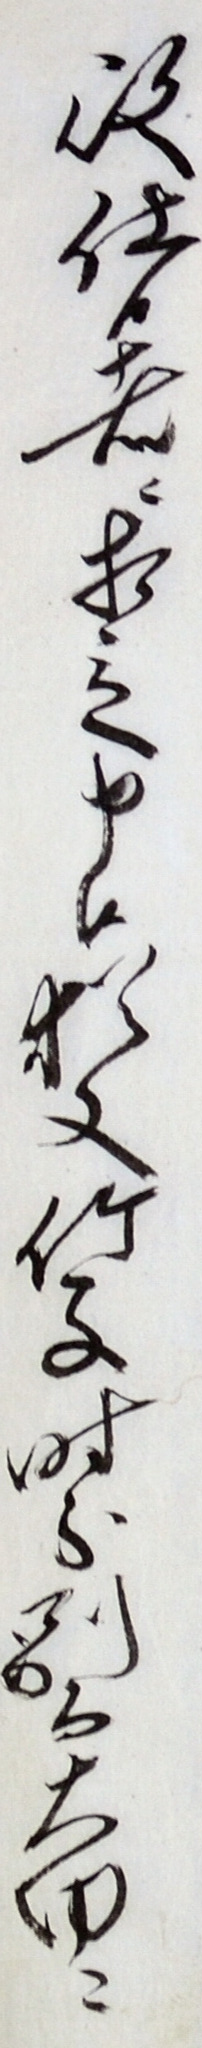役仕候者ニ相立申候猶又竹子時分別而大切ニ

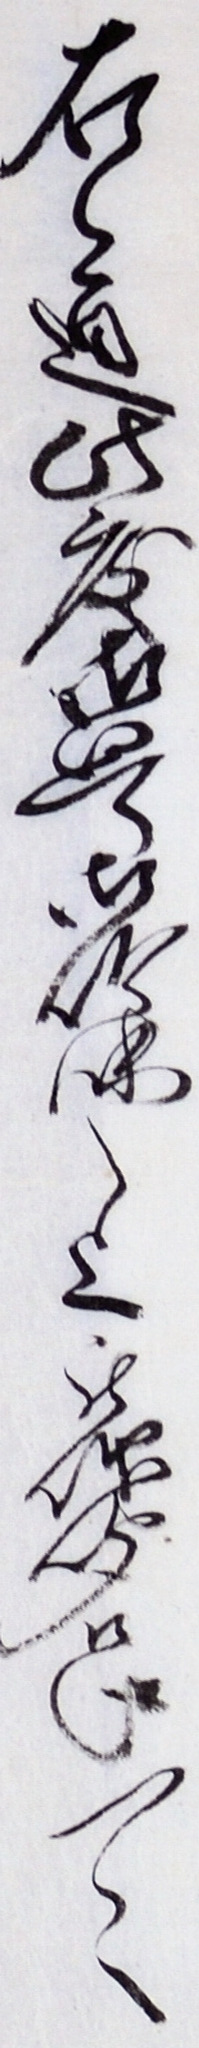右之通此度御廻り御吟味之上被仰聞候趣一々
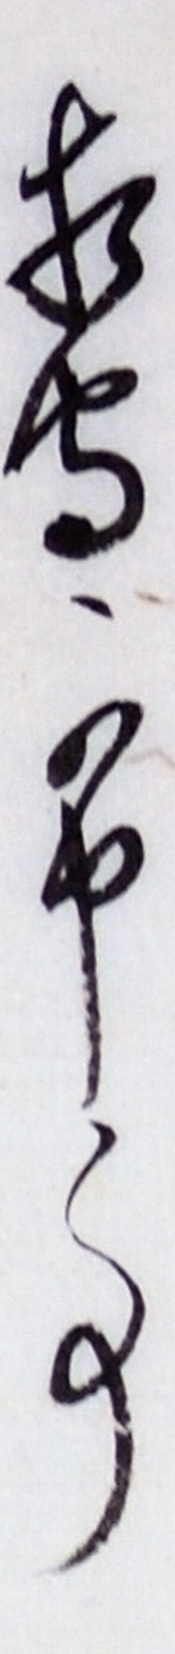相守可申事
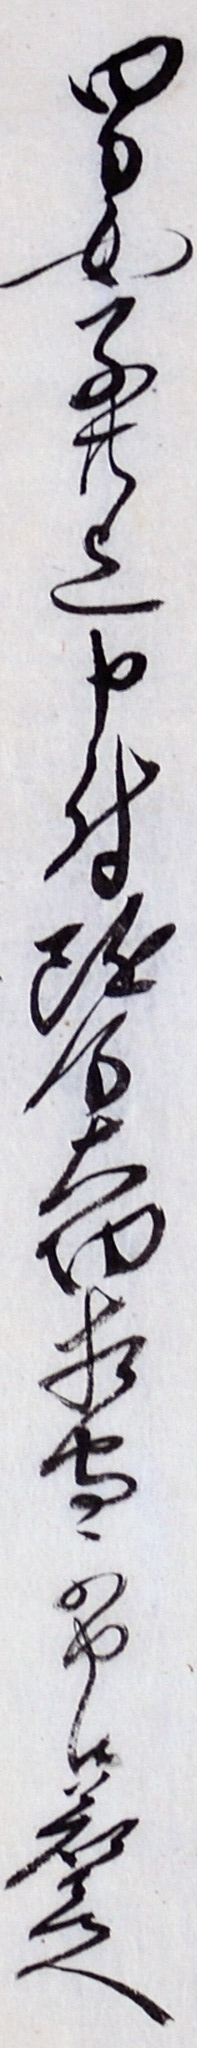男女子共迄申付随分大切相守可申候若壱人
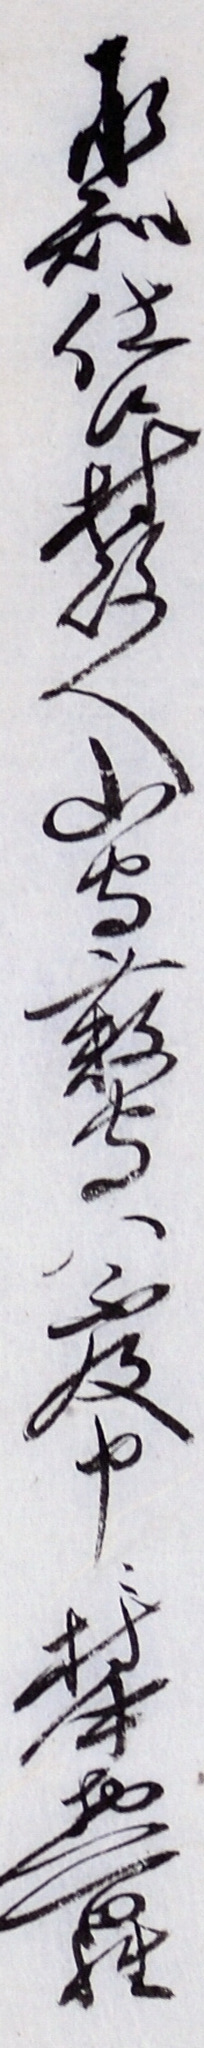承知仕候村役人山守薮守ハ不及申ニ村中惣百姓
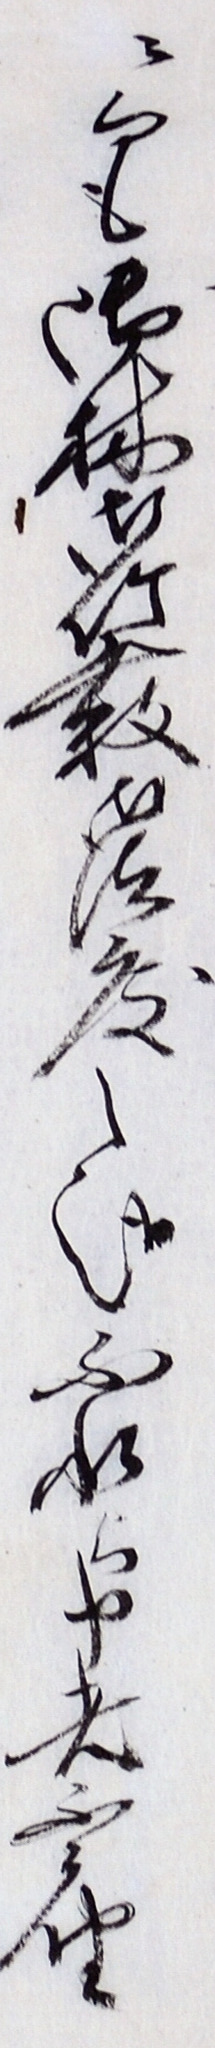ニ而も御林御竹薮御法度之趣不承与申者不届
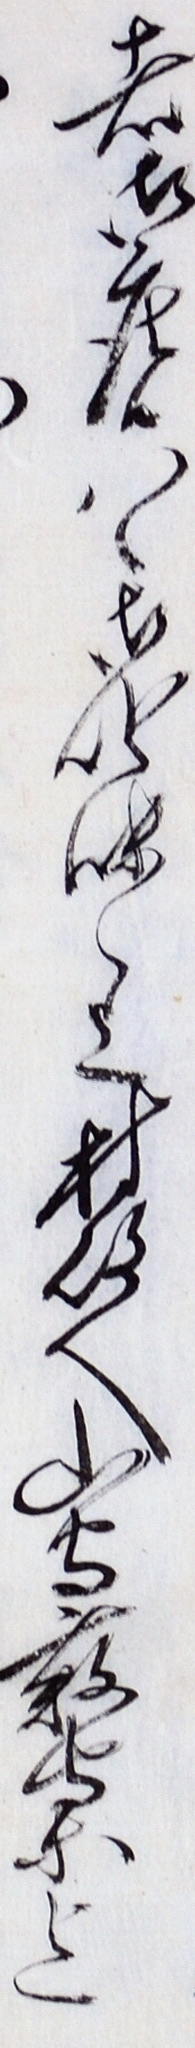者御座候ハヽ御吟味之上村役人山守薮守等迄
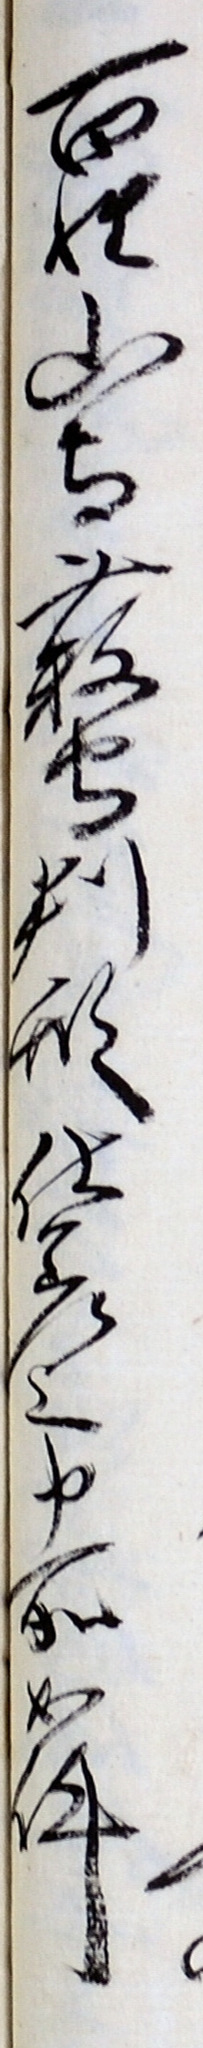百姓山守薮守判形仕差上申所如件
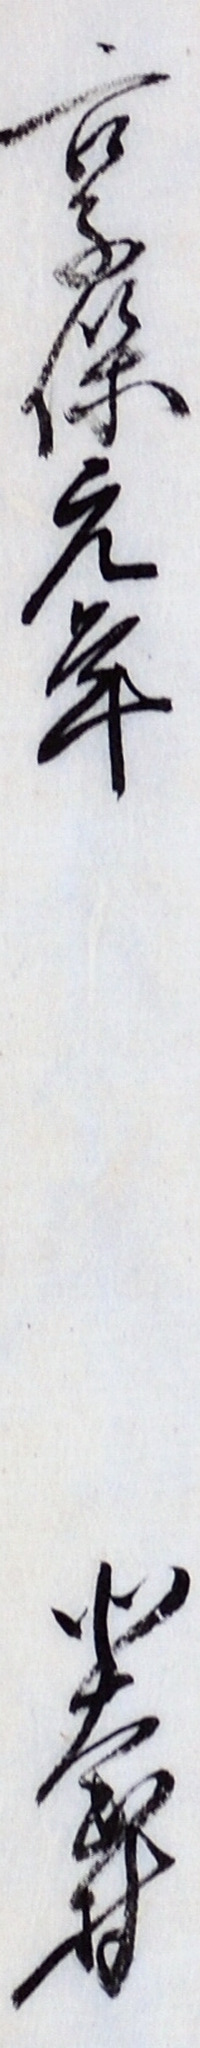享保元年北大出村
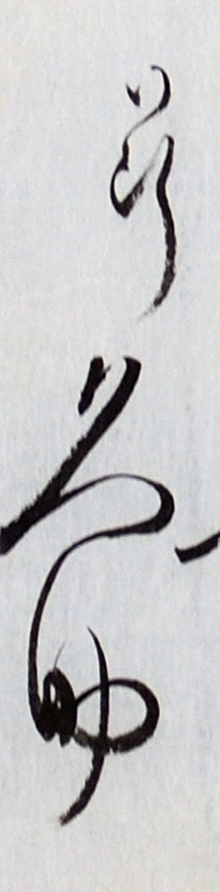同断久助
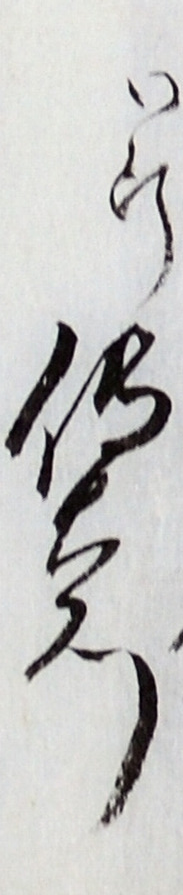同断伝右衛門
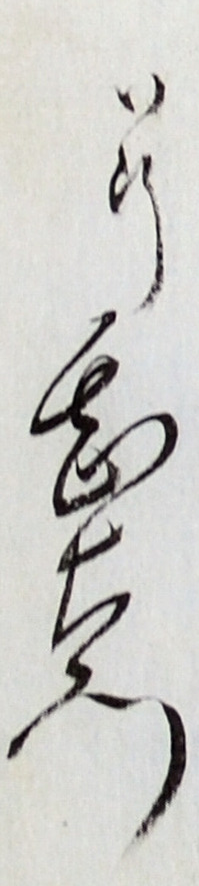同断甚右衛門

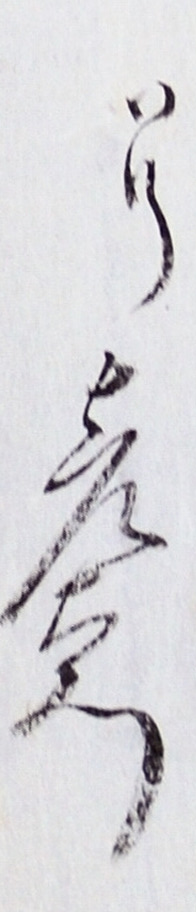同断彦右衛門
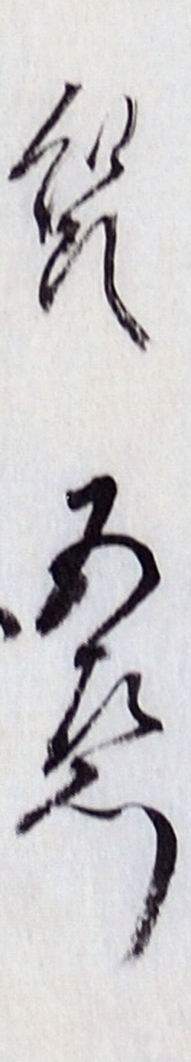組頭五左衛門
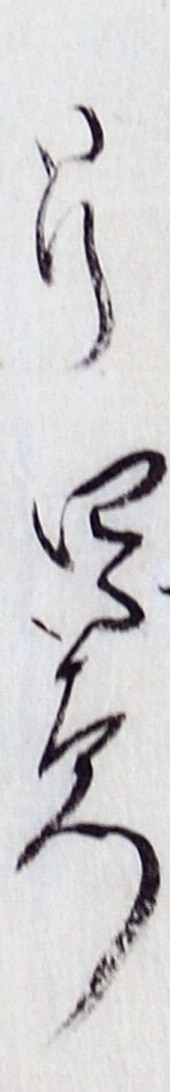同断四郎右衛門
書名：御林御竹藪証文控
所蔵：伊那市立高遠町図書館・合同会社AMANE
